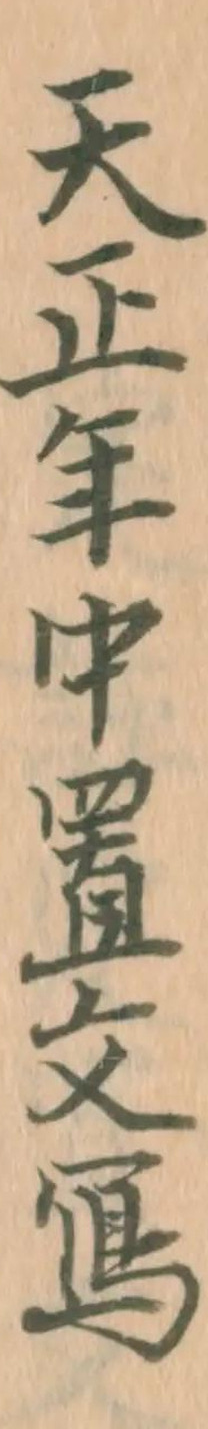天正年中置文冩
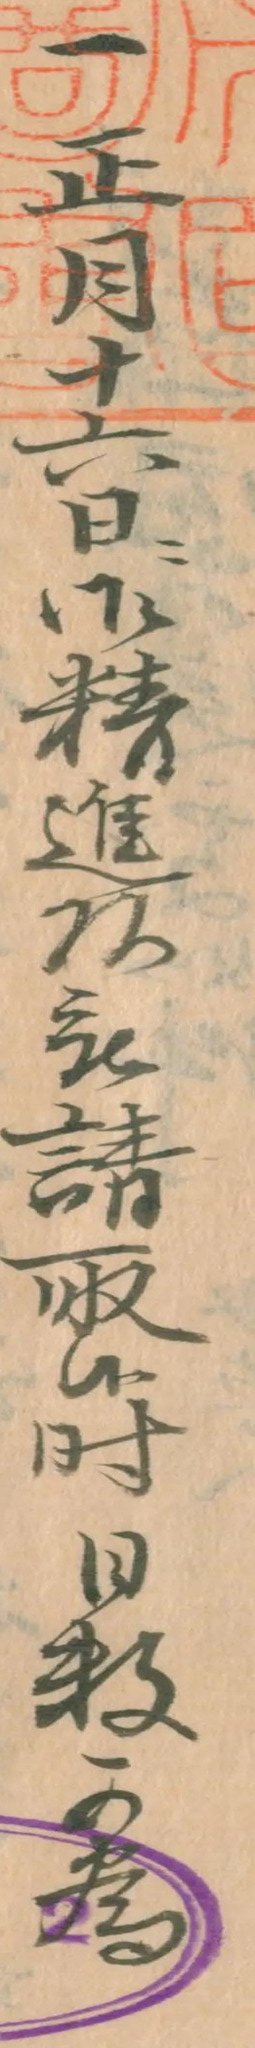一、正月十六日ニ御精進頭被請取候時日数可為
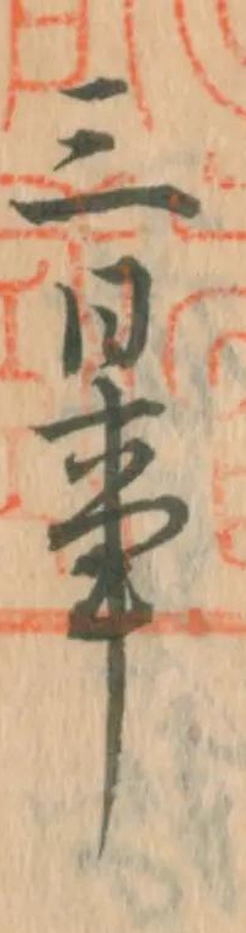三日事
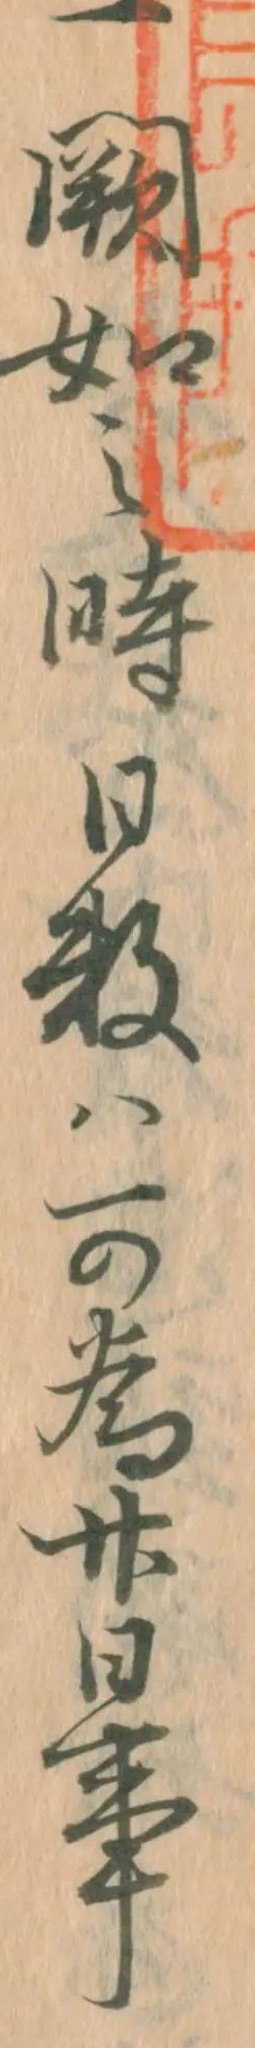一、闕如之時日数ハ可為廿日事
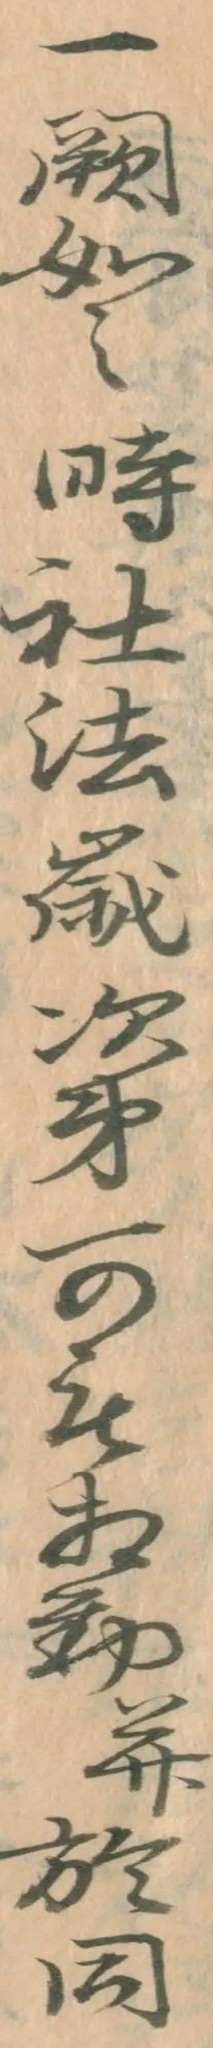一、闕如之時社法歳次第可被相勤并於同
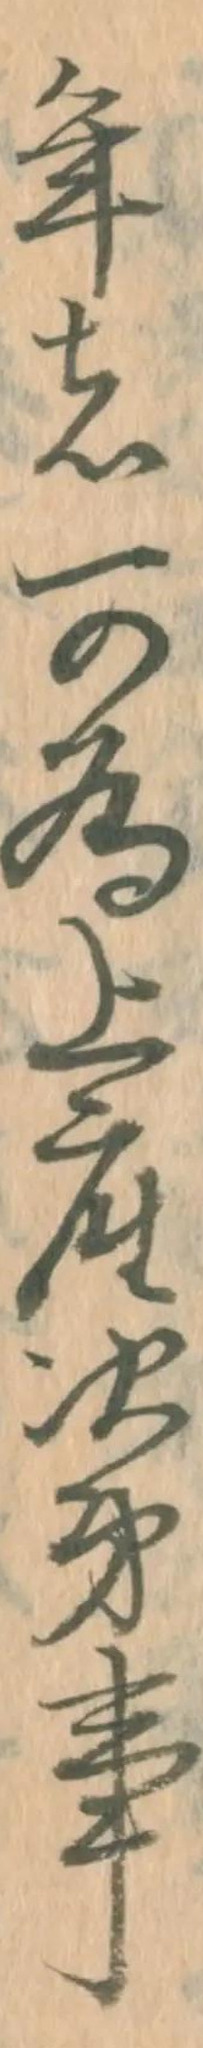年者可為上座次第事

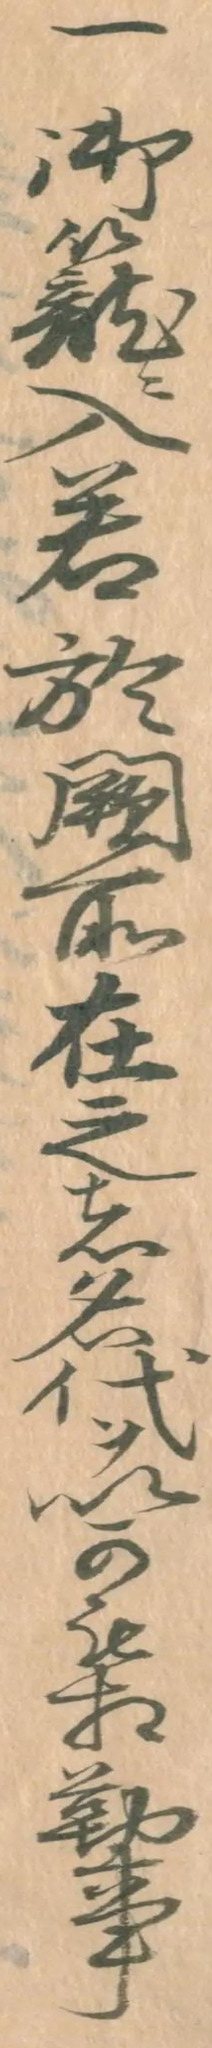一、御籠ニ入若於闕所在之者名代ヲ以可被相勤事
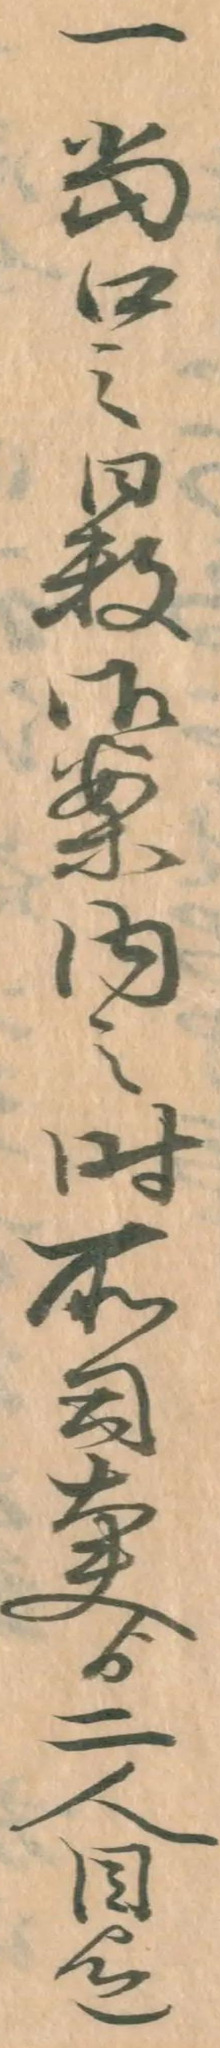一、当口之日数御案内之時所司大夫ゟ二人目迄
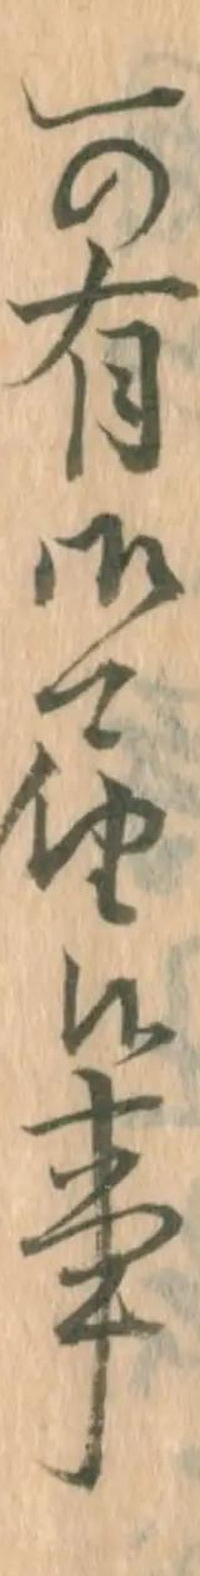可有御届候事
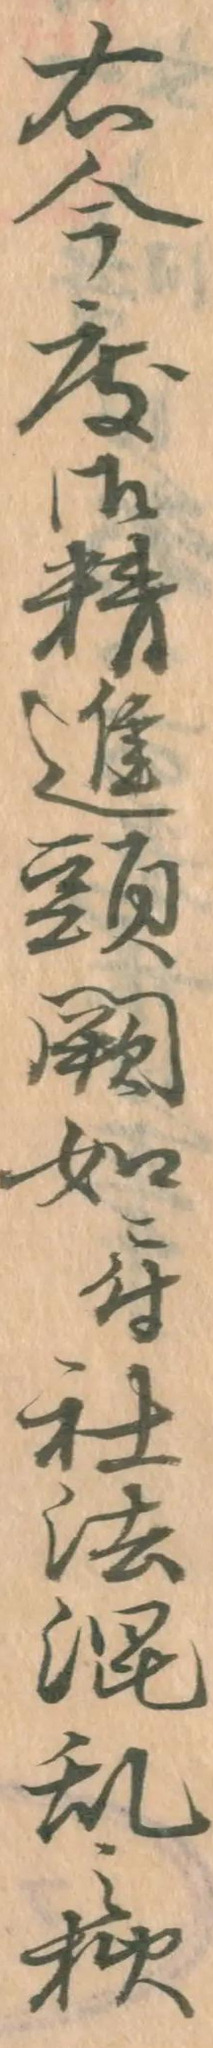右今度御精進頭闕如ニ付社法混乱之様
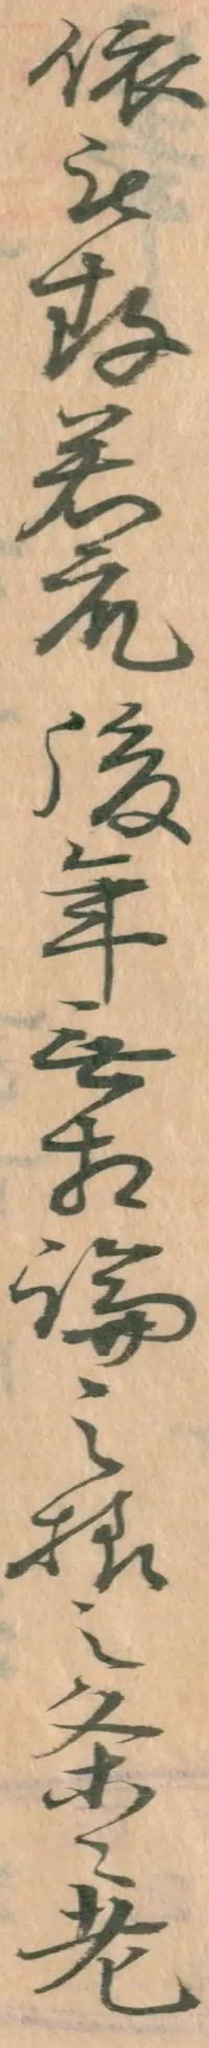依被存若衆後年無相論之様之条々老
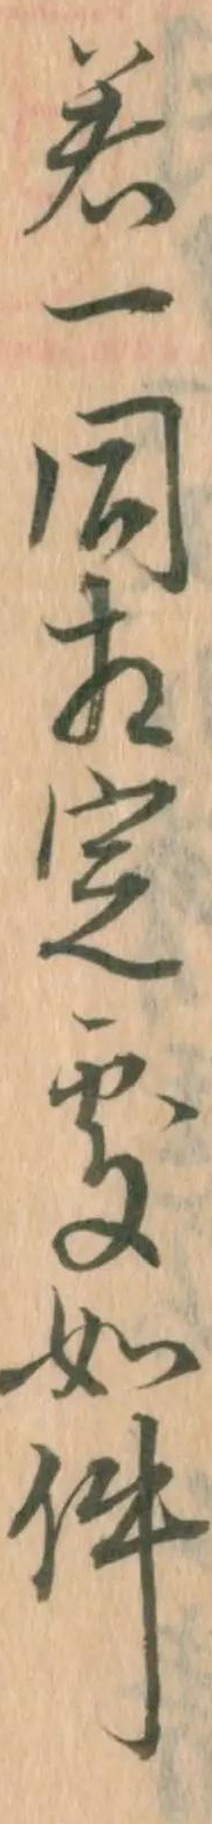若一同相定処如件
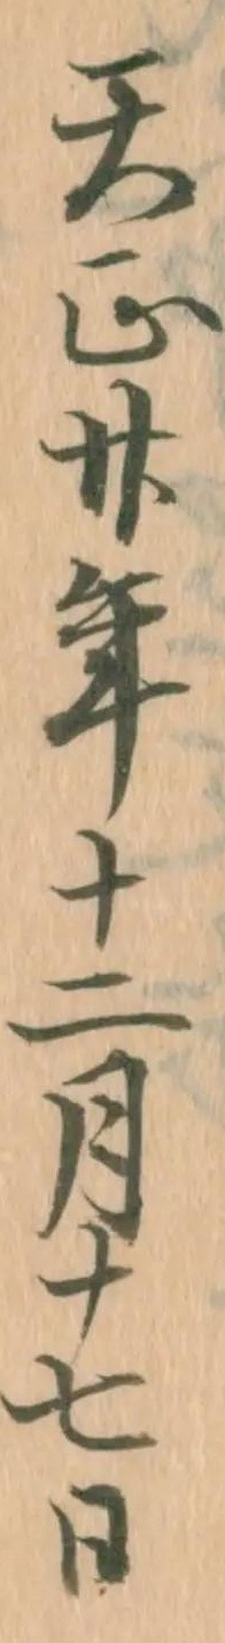天正廿年十二月十七日
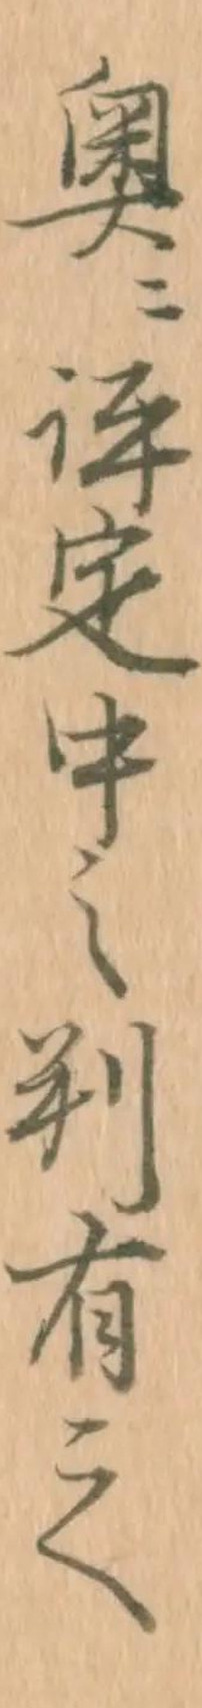奥ニ評定中之判有之
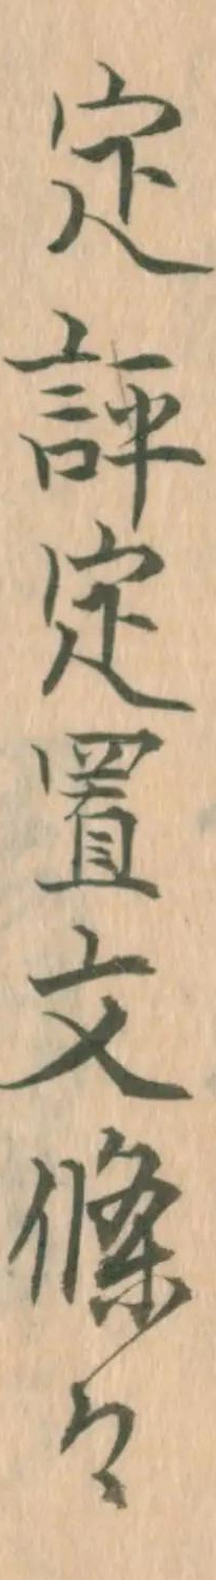定評定置文条々
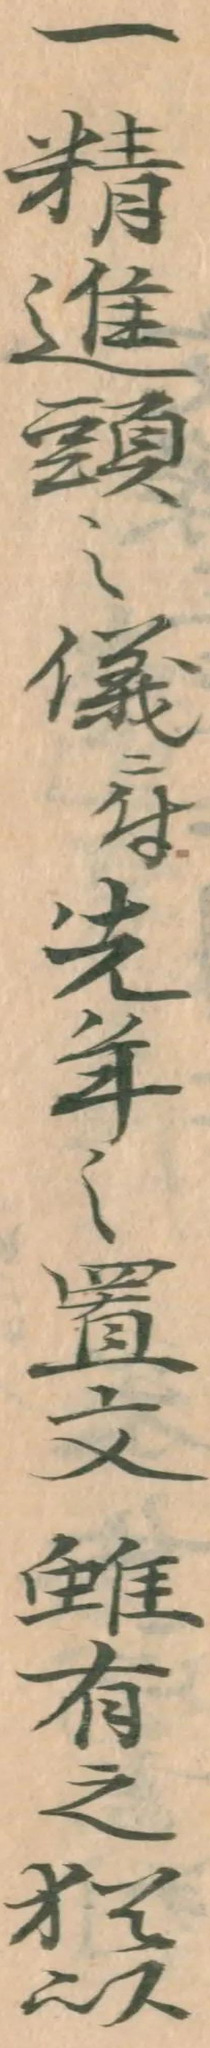一、精進頭之儀ニ付先年之置文雖有之猶以
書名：賀茂社記録. 第39冊
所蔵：国立国会図書館 National Diet Library, JAPAN
